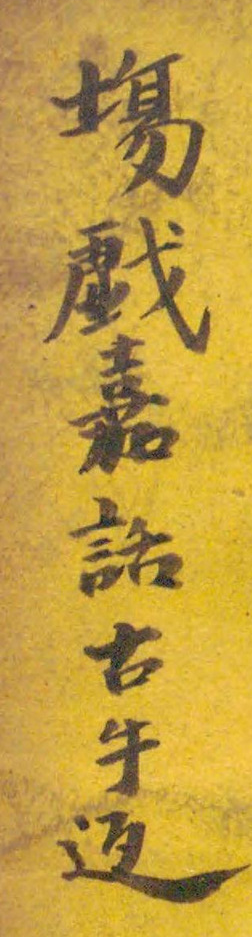場戯嘉話古手返

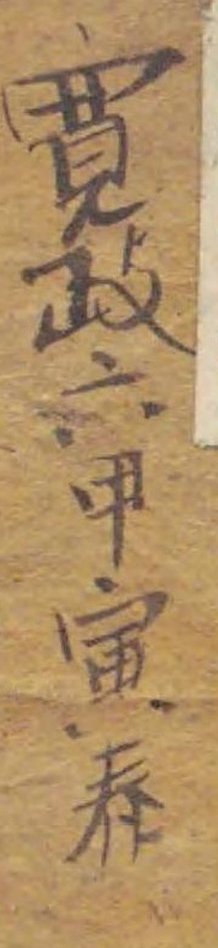寛政六甲寅春
